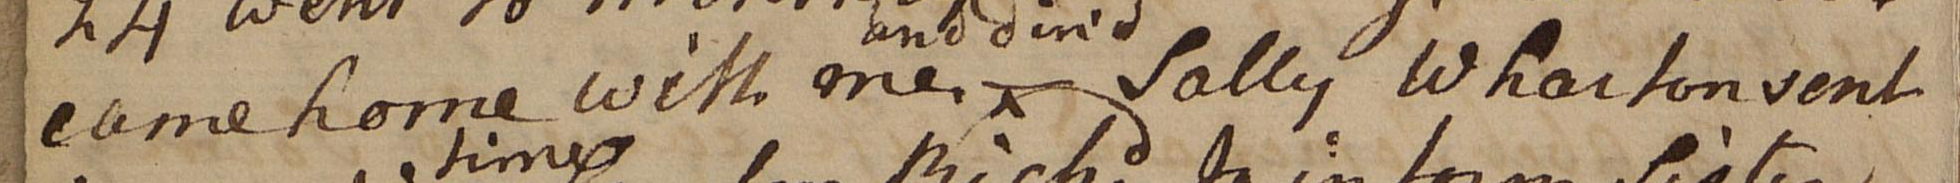came home with me,^ - Sally Wharton sent
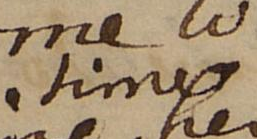time
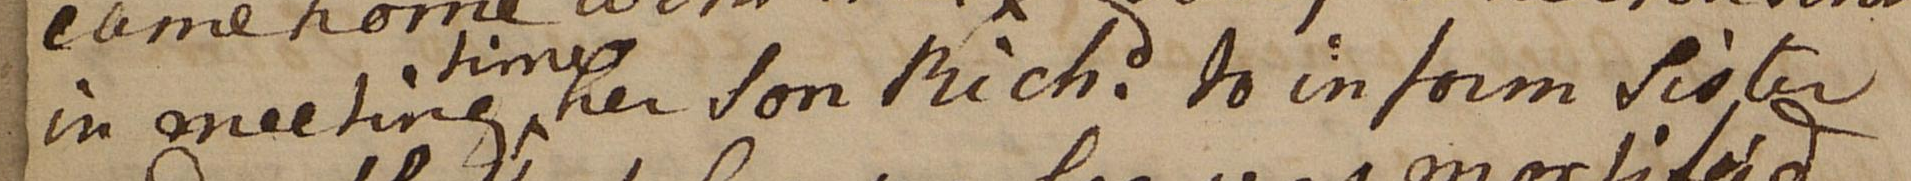in meeting ^ her son Rich^d. to inform Sister
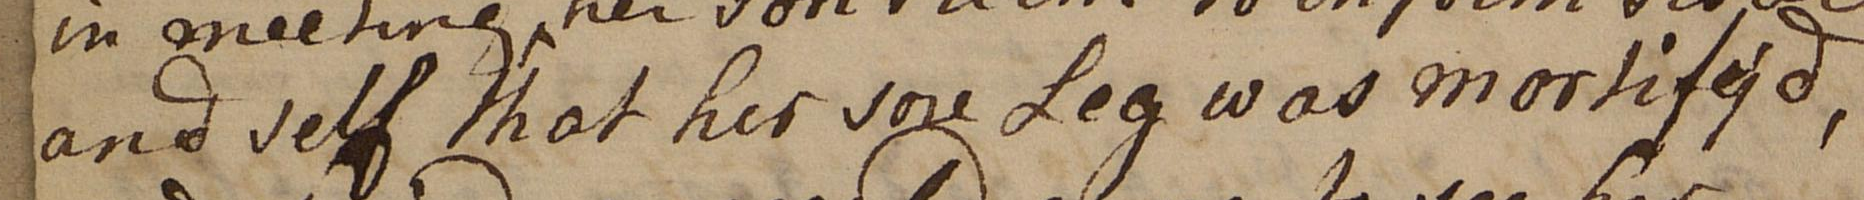and self that her sore Leg was mortify'd,
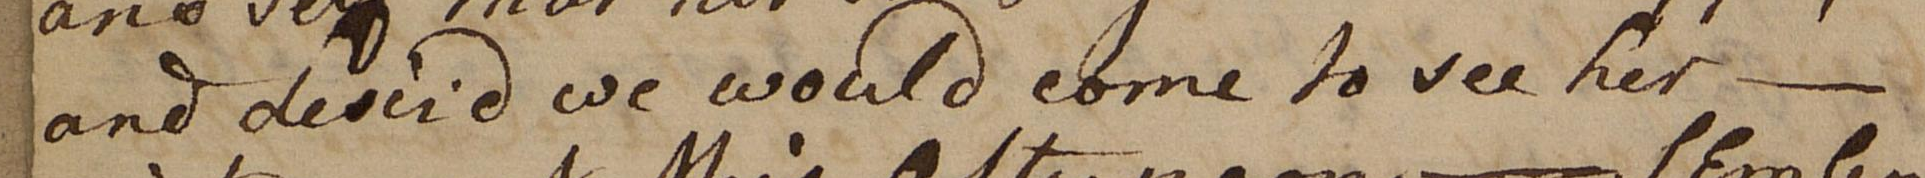and desir'd we would come to see her-
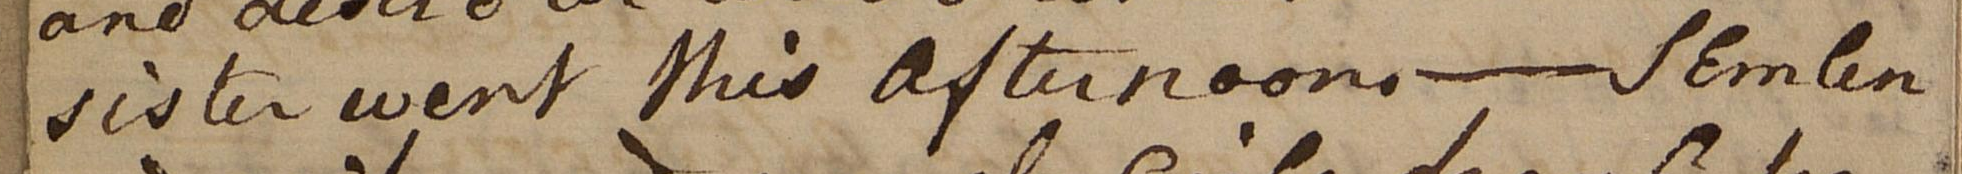sister went this afternoon- S Emlen
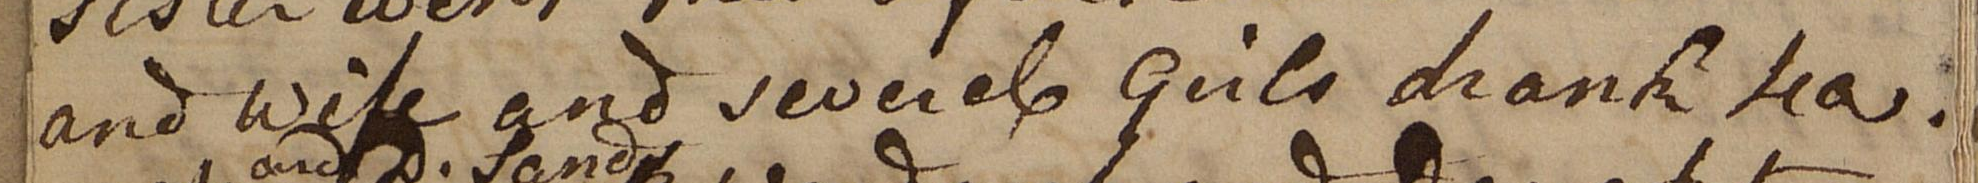and wife and severel Girls drank tea
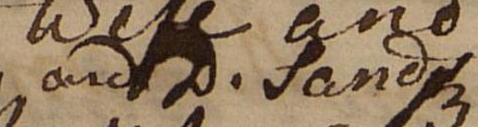and D. Sands
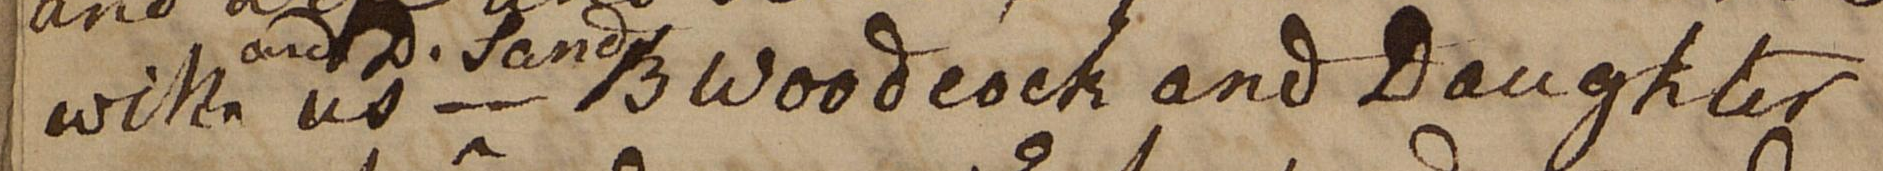with us- B Woodcock and Daughter
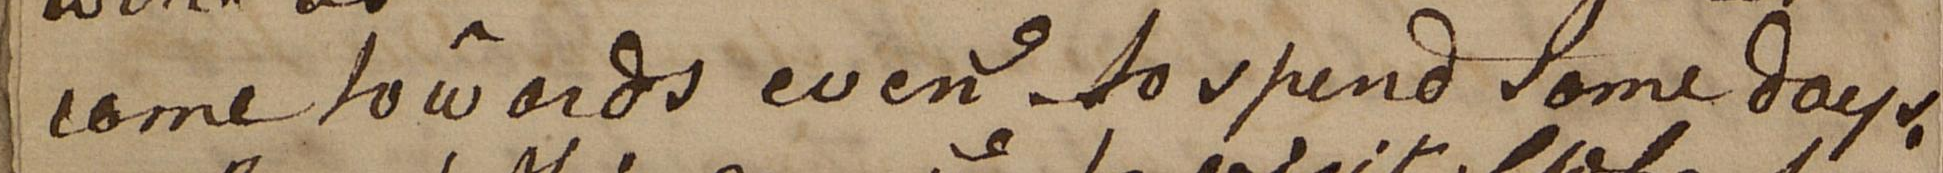came towards even^g to spend some days.
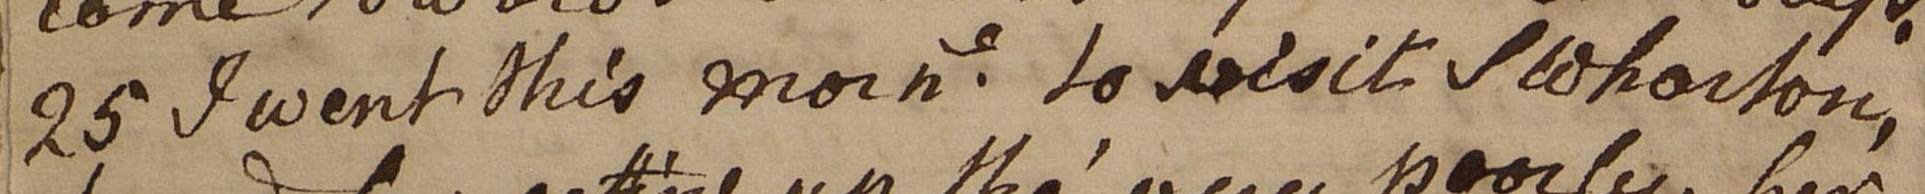25 I went this morn^g. to visit S Wharton,
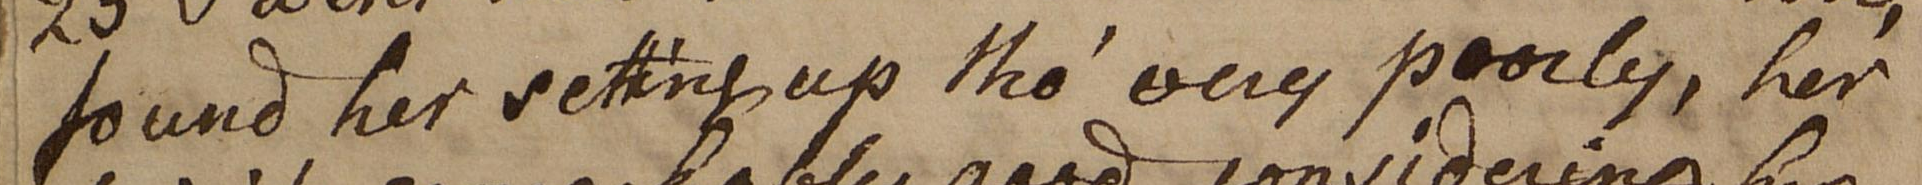found her setting up tho' very poorly, her
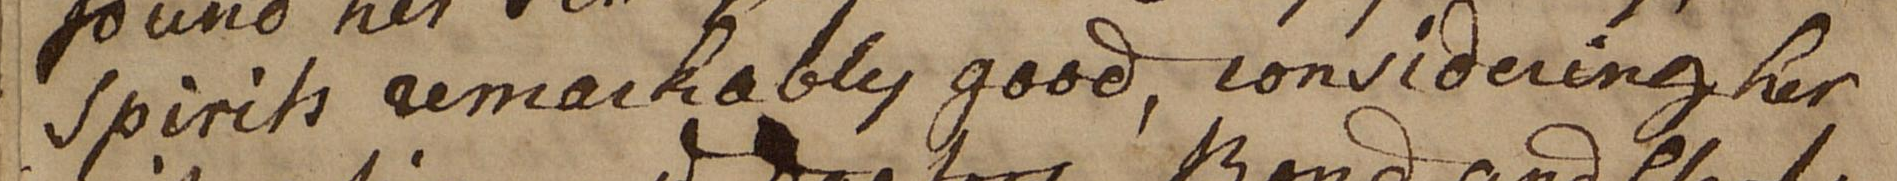Spirits remarkably good, considering her
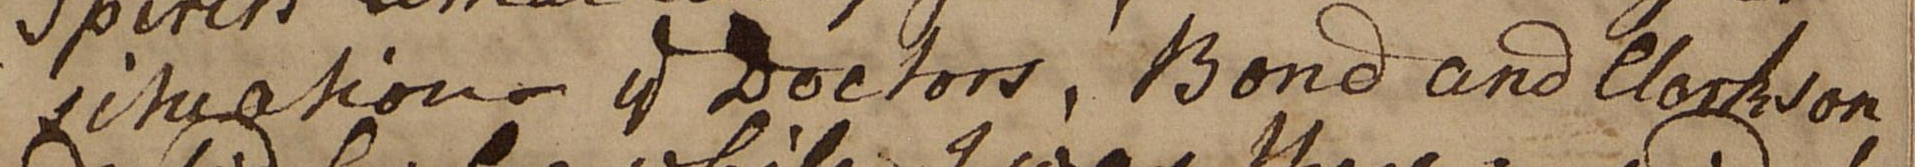situation- y^e Doctors, Bond and Clarkson
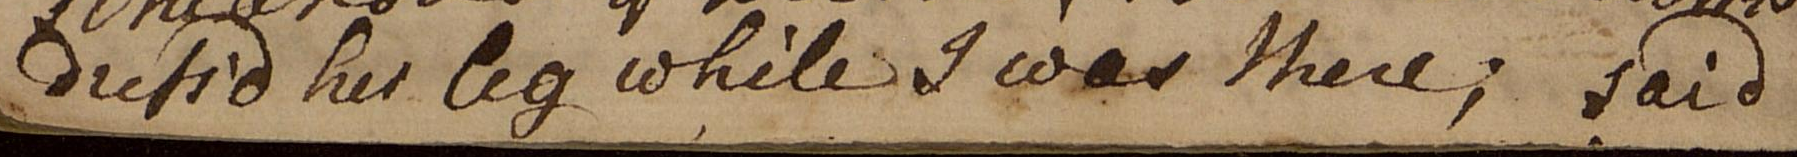dress'd her leg while I was there, said
